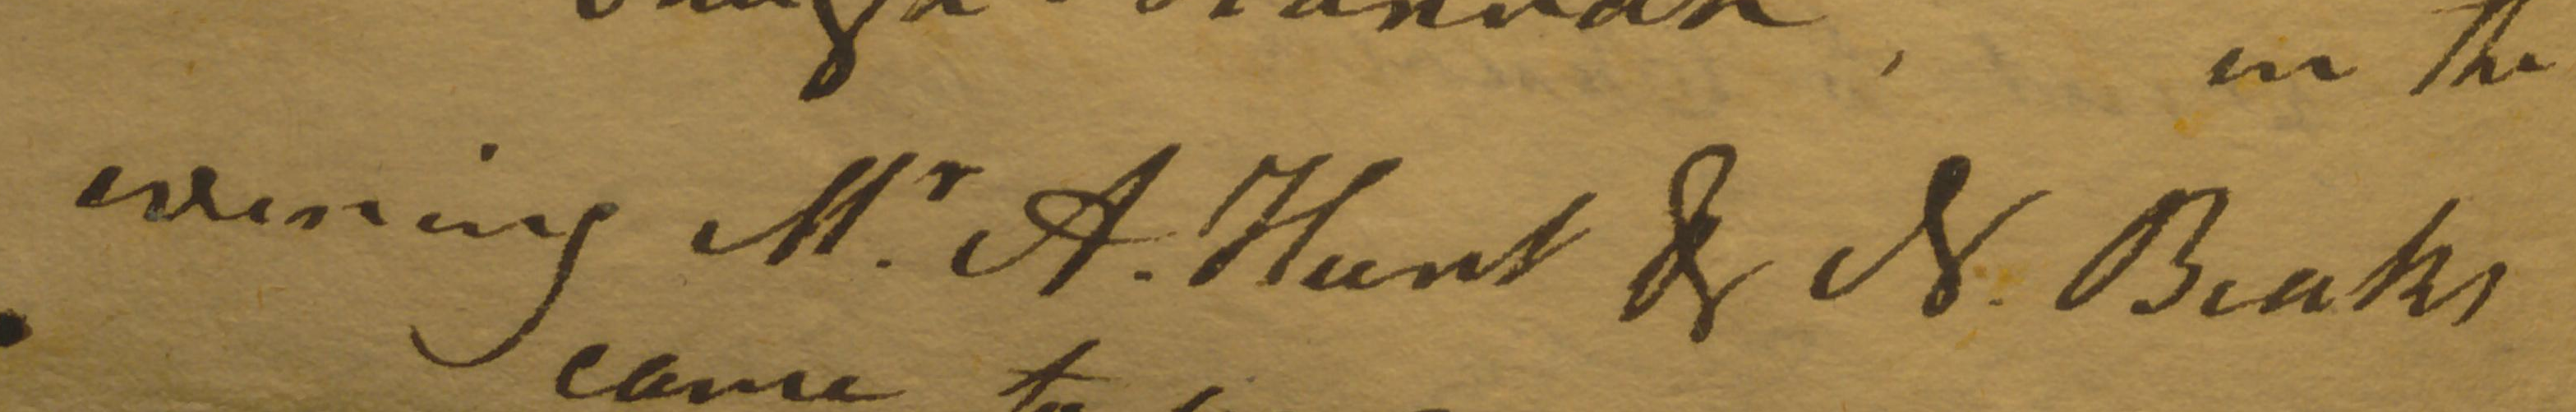evening M^r. A. Hunt & N. Beaks
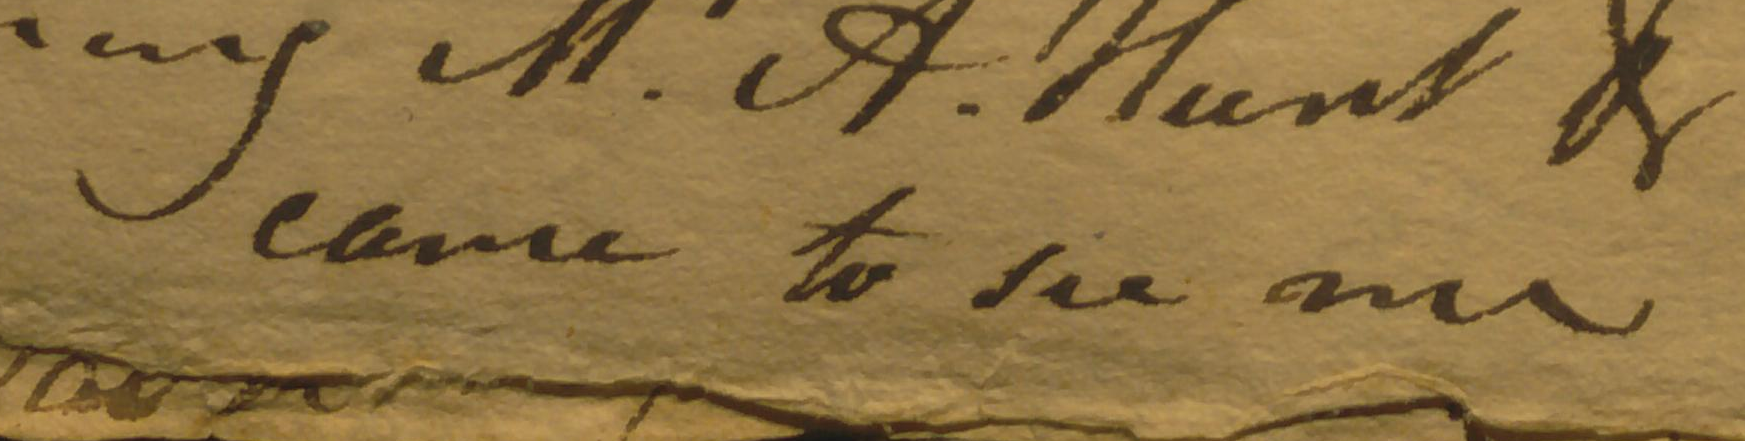came to see me
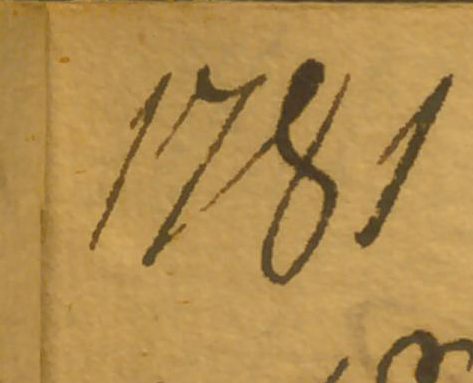1781
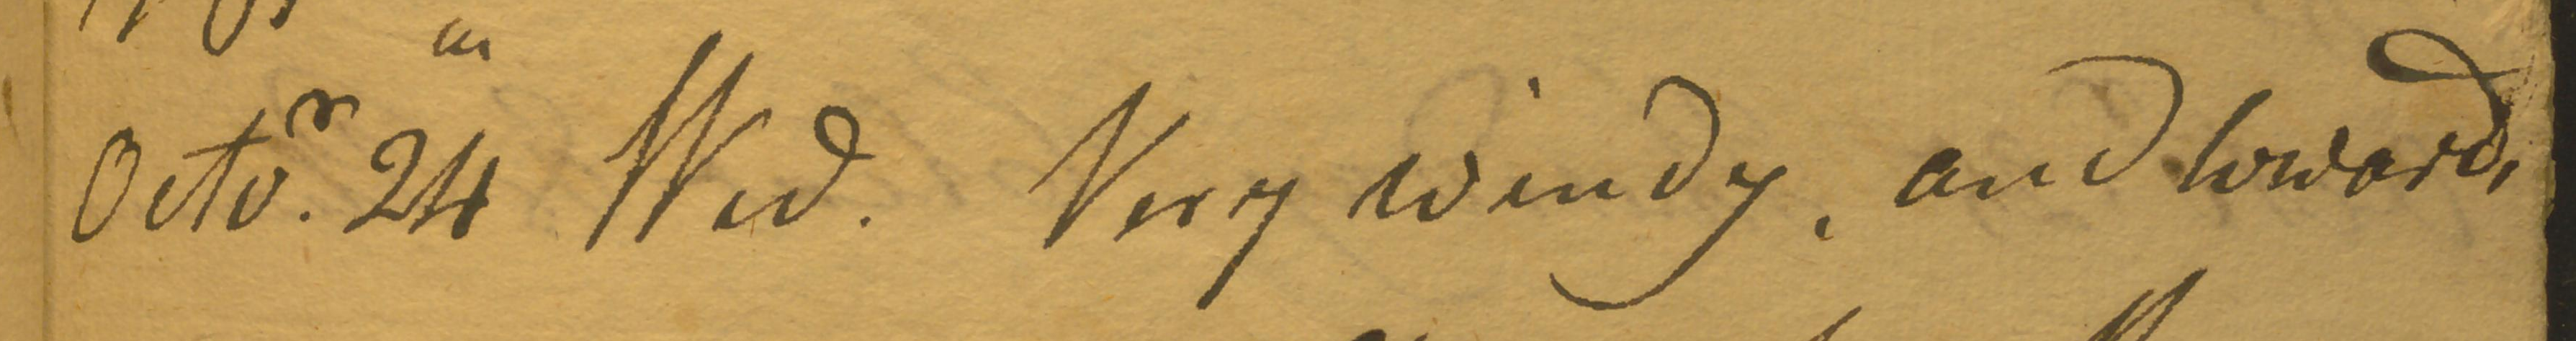Oeto^r. 24 Wed. Very windy, and towards
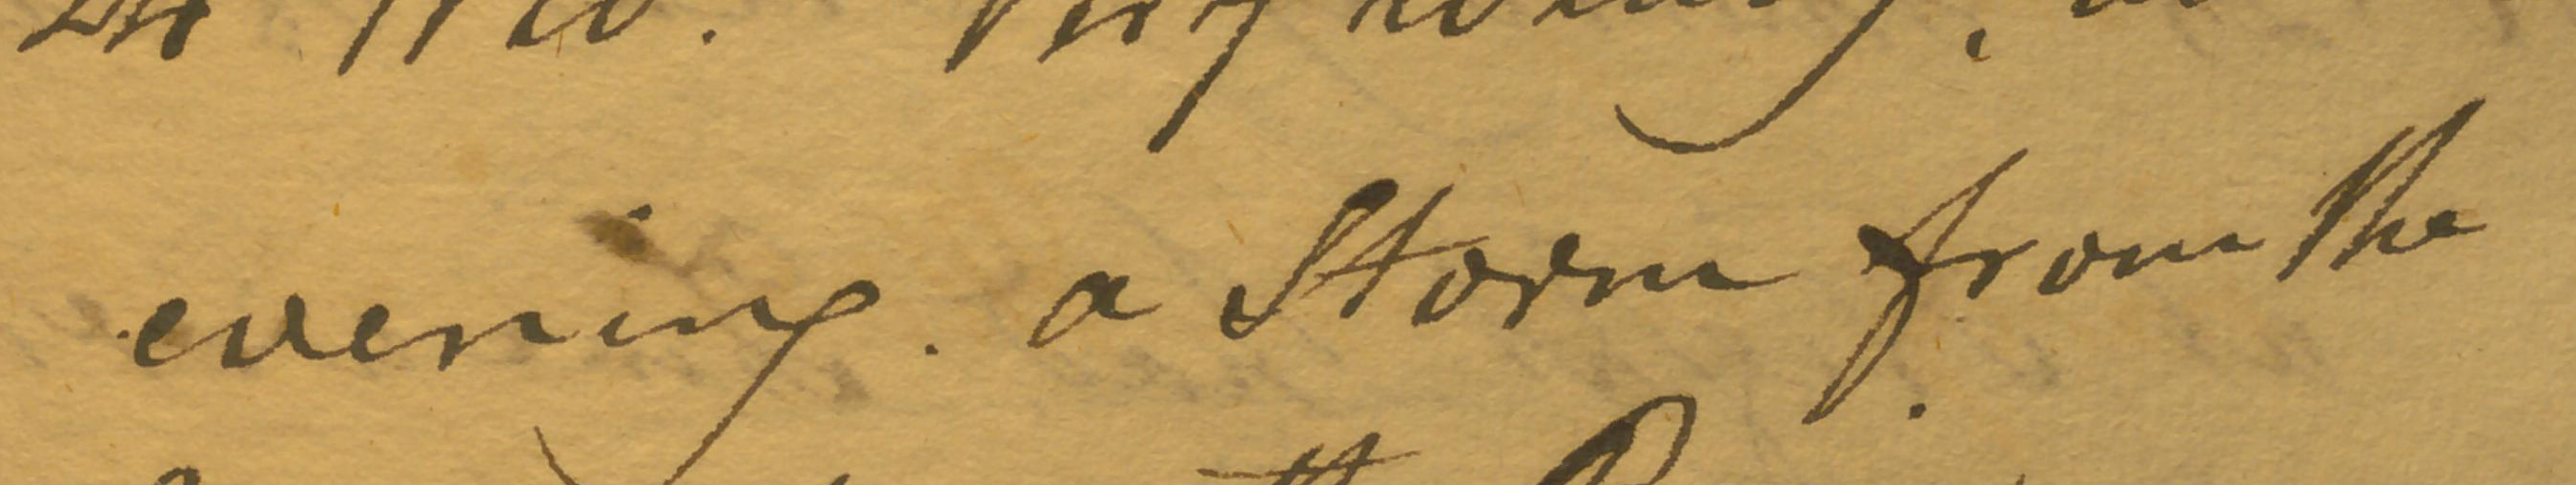evening, a Storm from the
